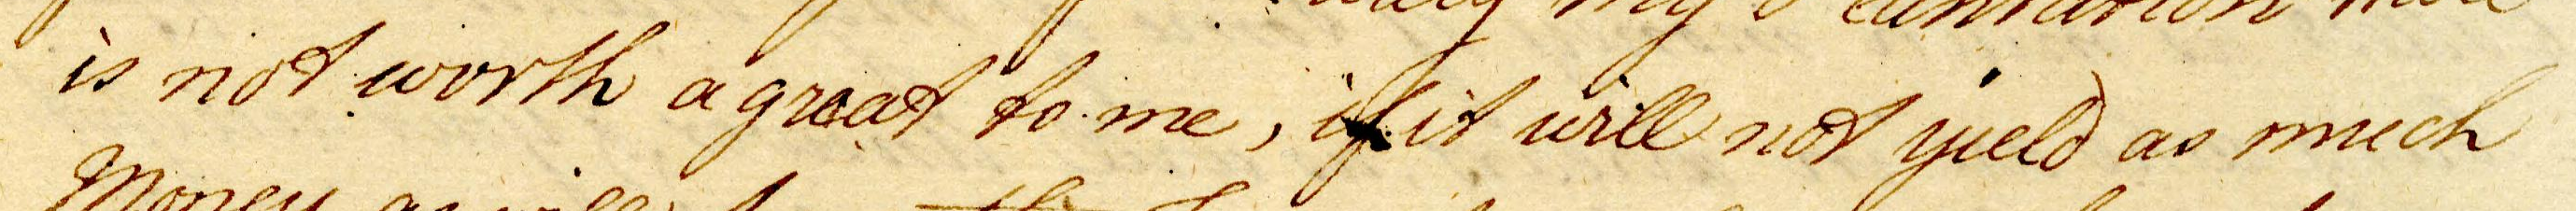is not worth a great to me, if it will not yield as much
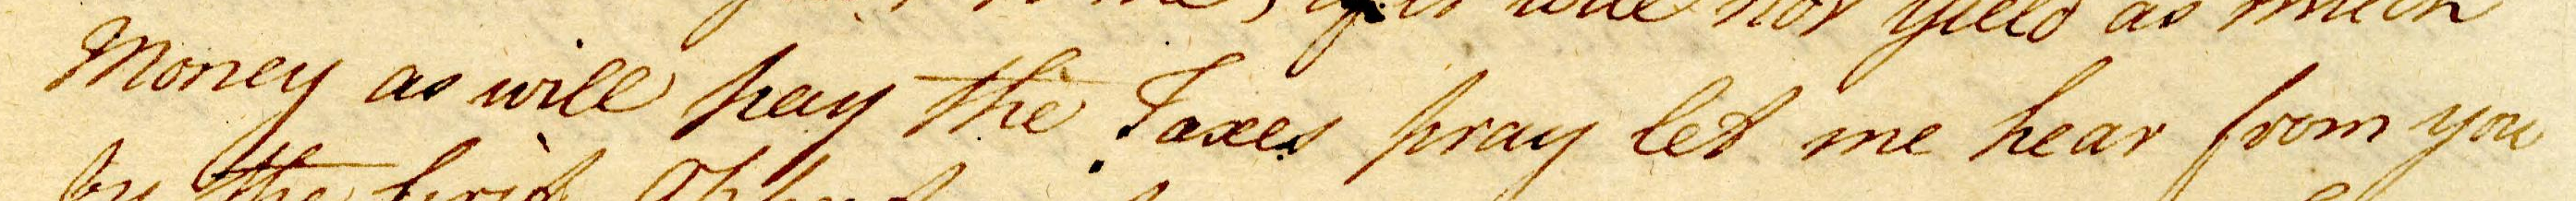Money as will pay the Taxes pray let me hear from you
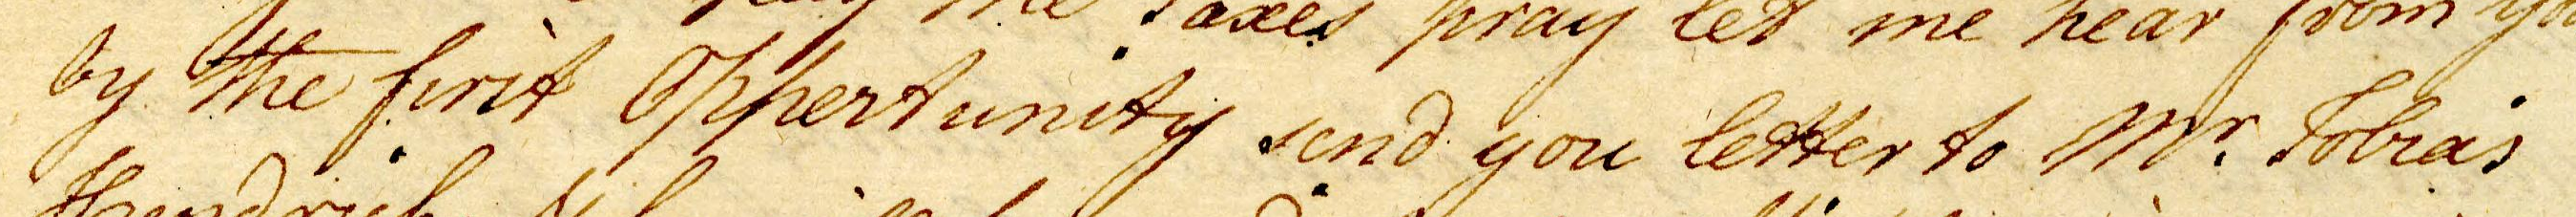by the first Opportunity send you letter to M^r. Tobias
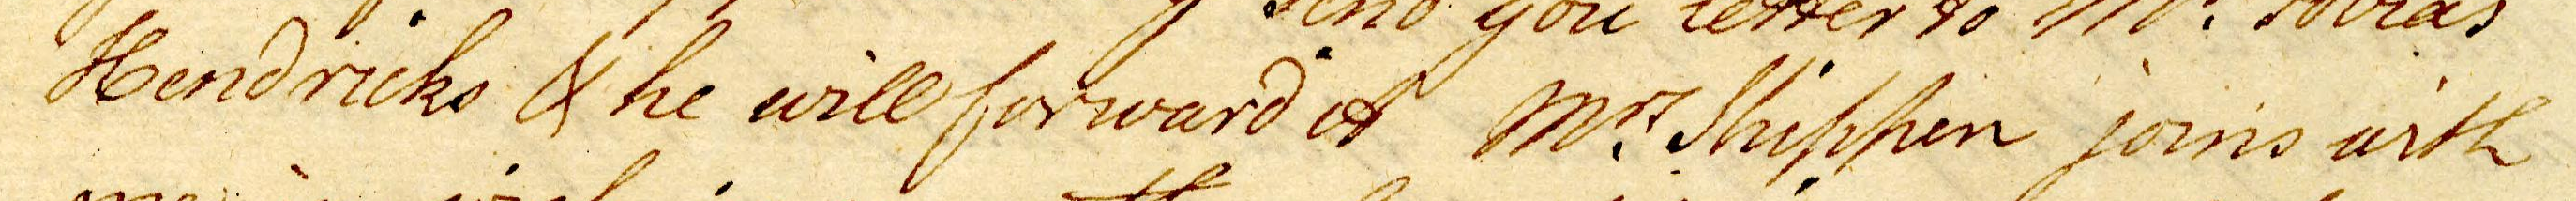Hendricks & he will forward it M^rs. Shippen joins with
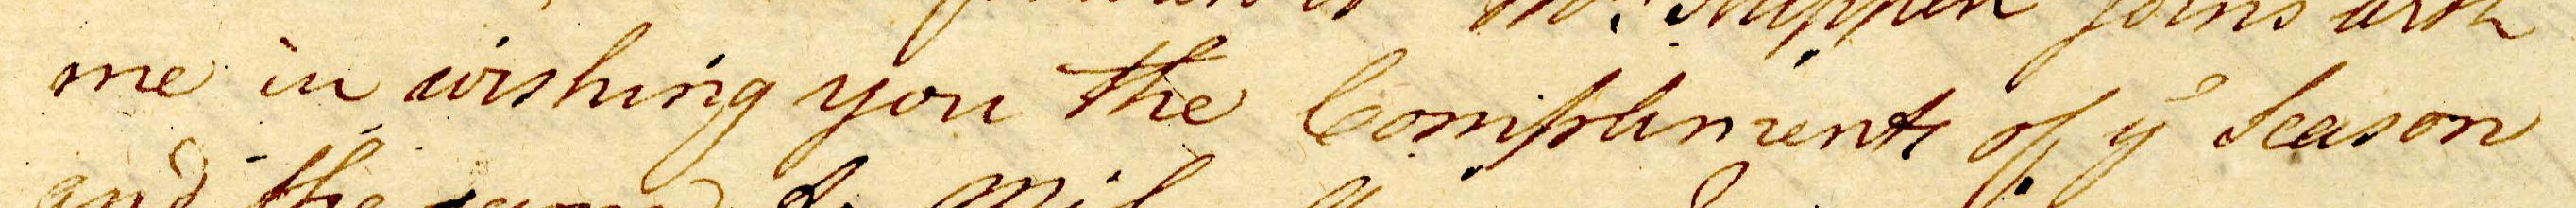me in wishing You the Compliments of y^e season
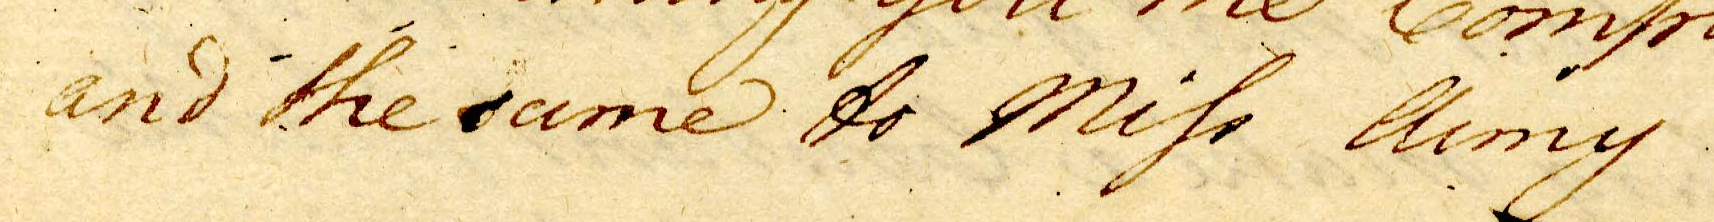and the same to Miss Aimy
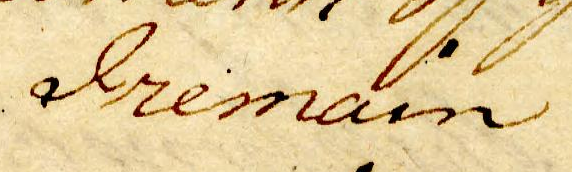I remain
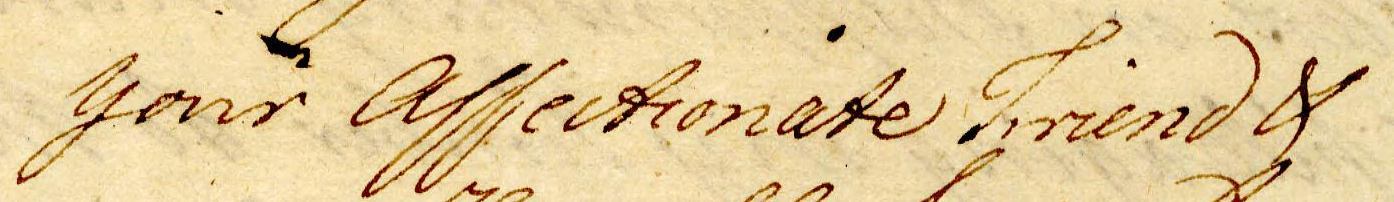Your Affectionate Friend &
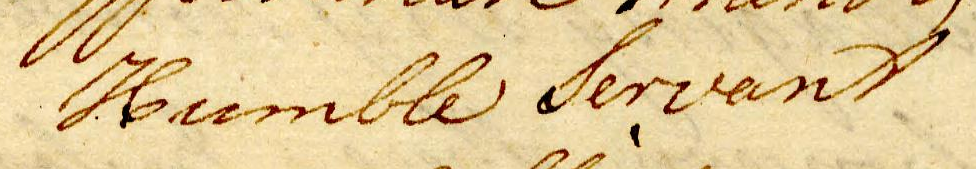Humble Servant
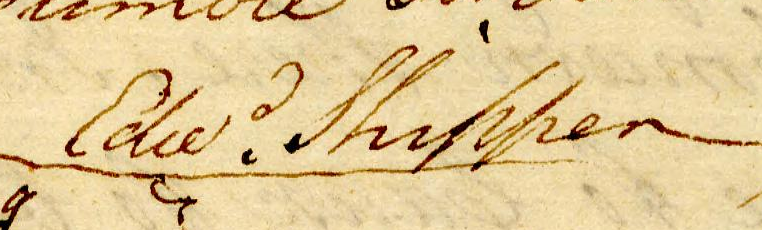Edw^d. Shippen
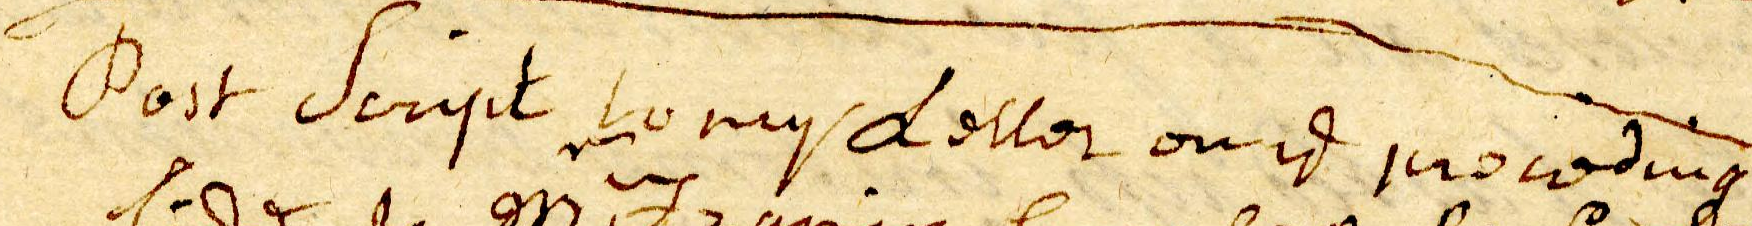Post Script to my Letter on y^e preceding
